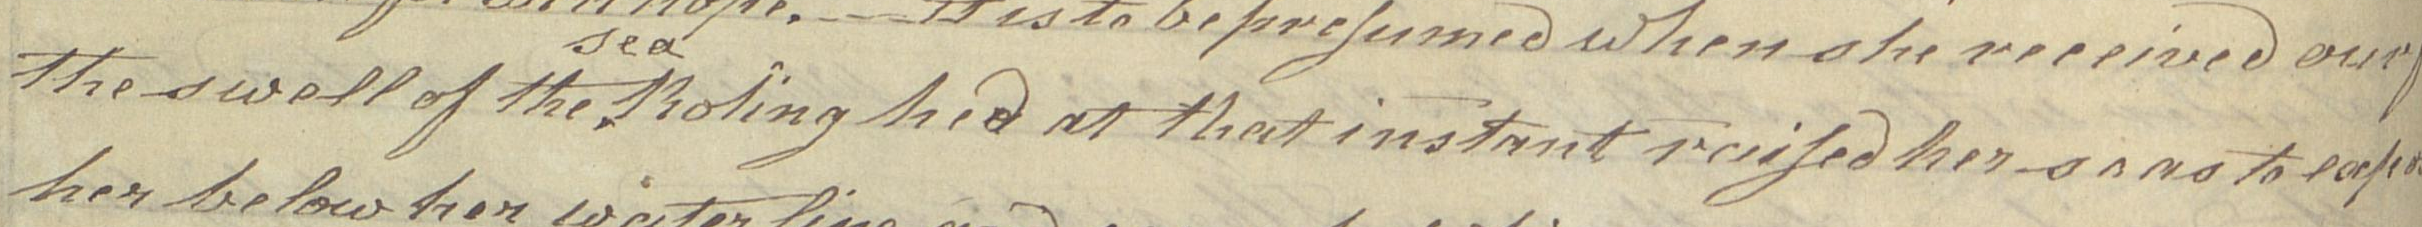the swell of the ^ Roling hid at that instant raised her seas to cap-
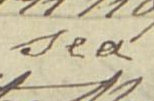Sea
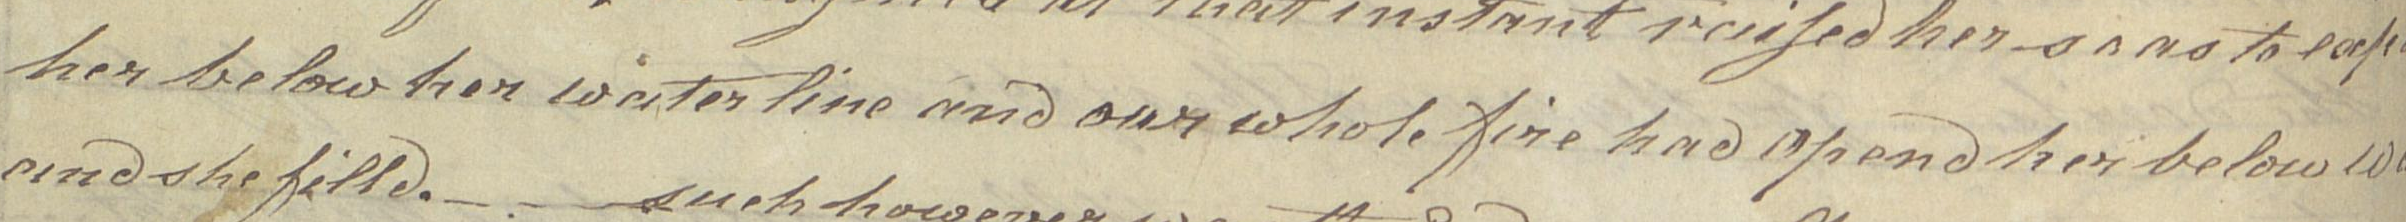her below her water line and our whole fire had Opend her below w-
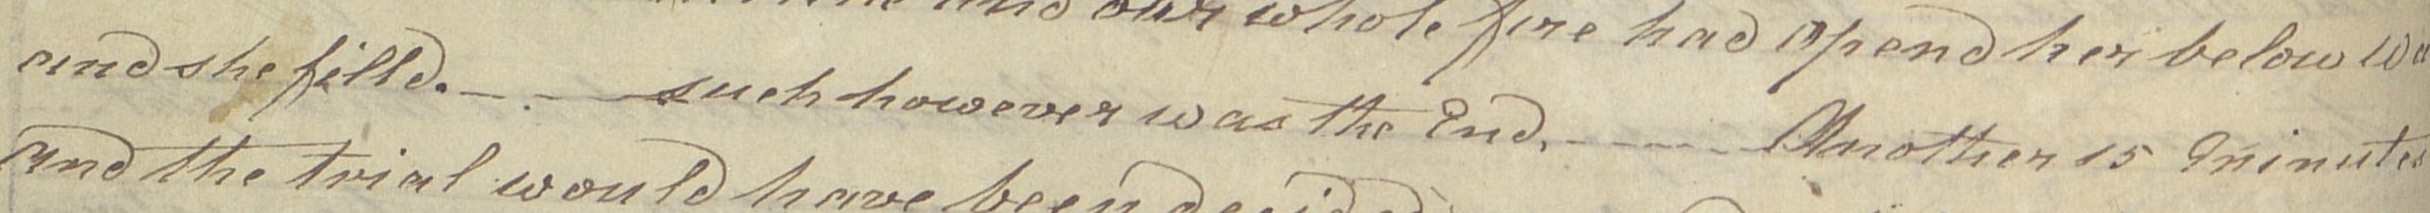and she filld. Such however was the End. Another 15 Minutes
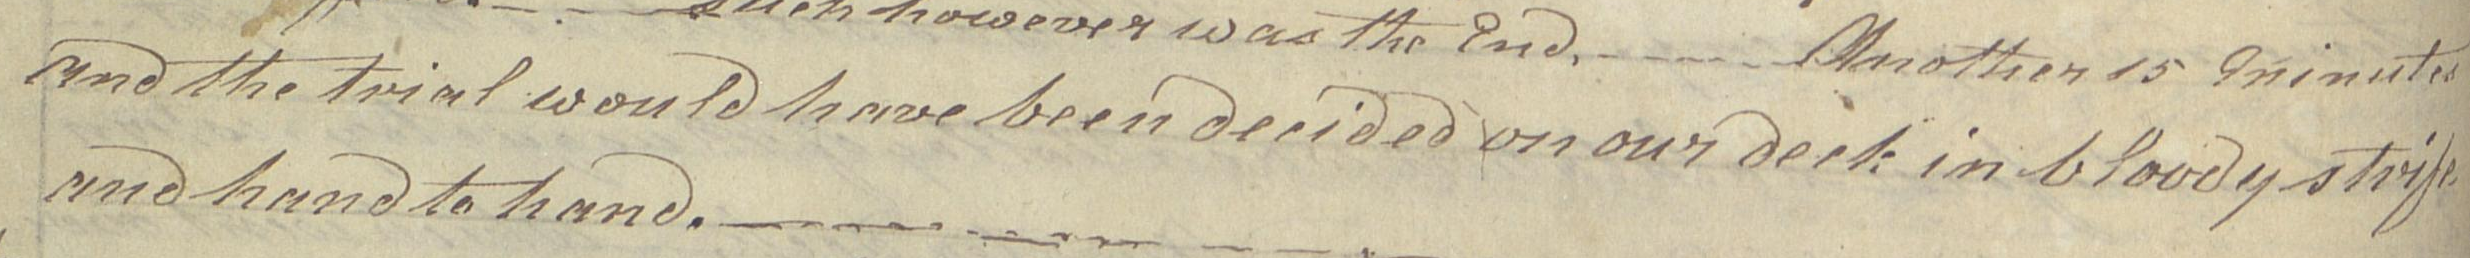and the trial would have been decided on our deck in bloody strife
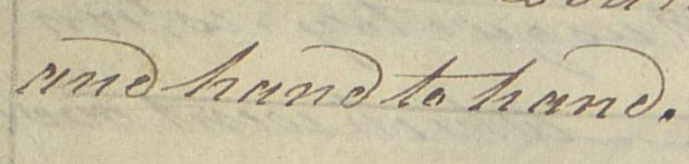and hand to hand.
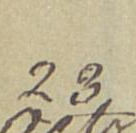23
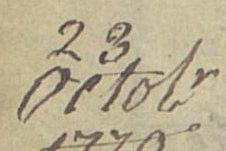Octob^r
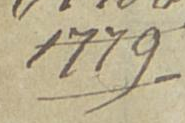1779
